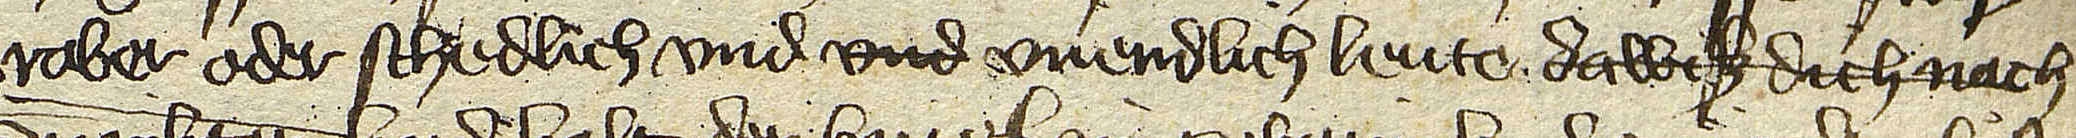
rober oder ſchedlich vnd vnd vnendlich leute da wiſʒ dich nach
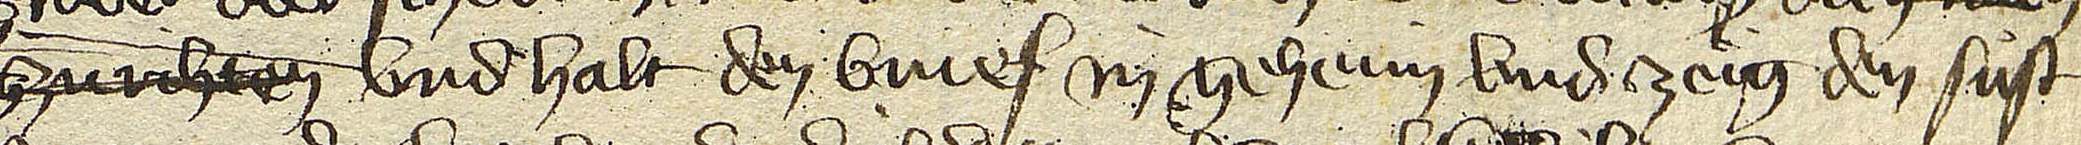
cʒu richten vnd halt den brief in geheim vnd cʒeig den ſüſt
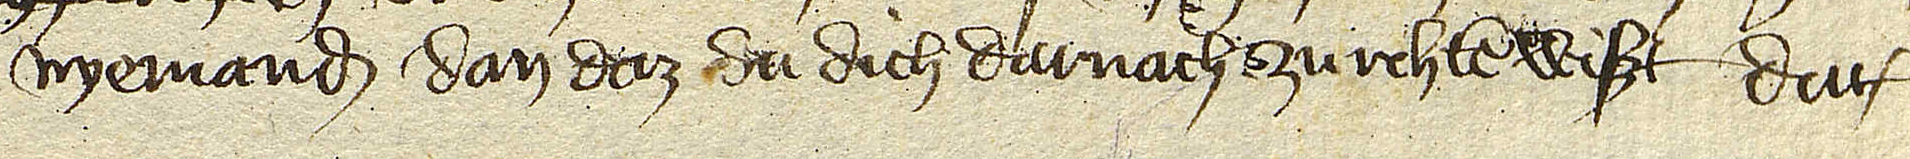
nyemand* / dan daʒ du dich darnach cʒu rihte wiſʒt dat*
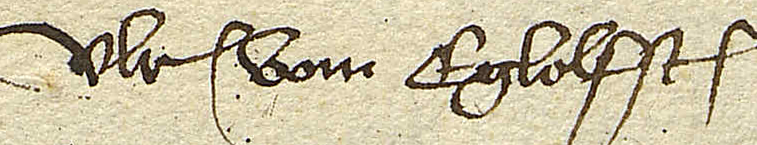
Vlr* von Eglolfſt*
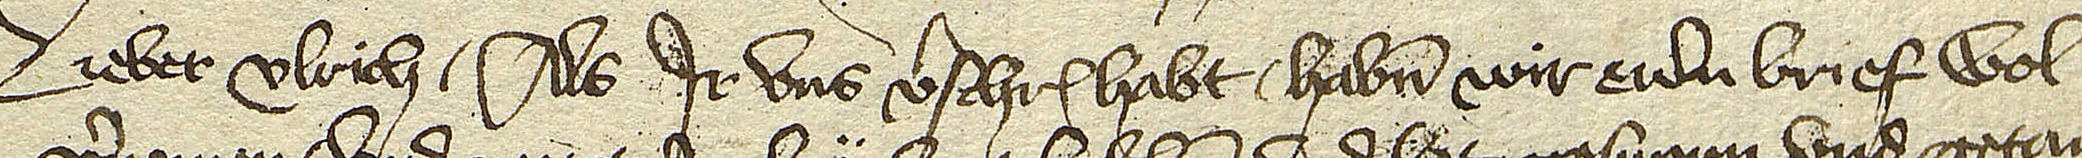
Lieber vlrich / Als Ir vns v*ſchr* habt / habn* wir ew*n brief wol
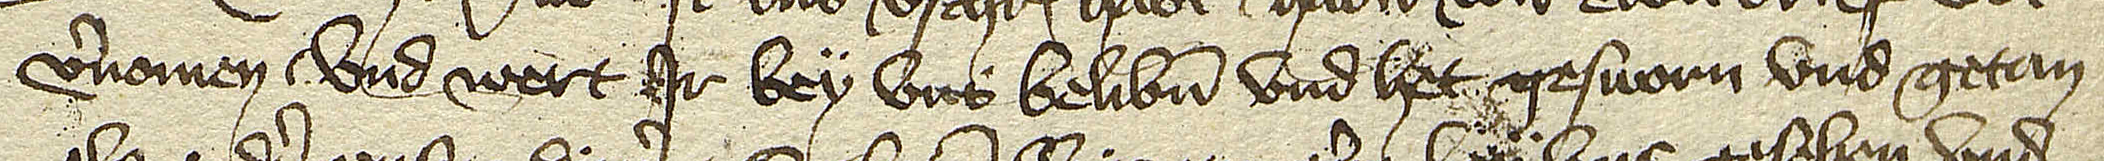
v*nomen / vnd wert ir bey vns belibn* vnd het geſworn vnd getan
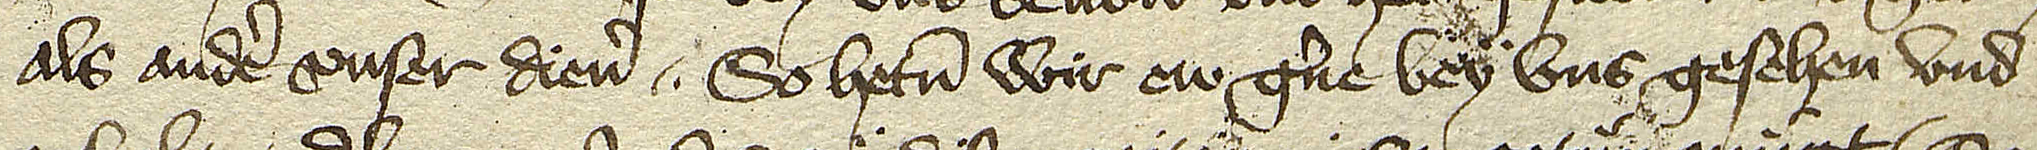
als and* vnſer dien* / . So hetn* wir ew g*ne bey vns geſehen vnd
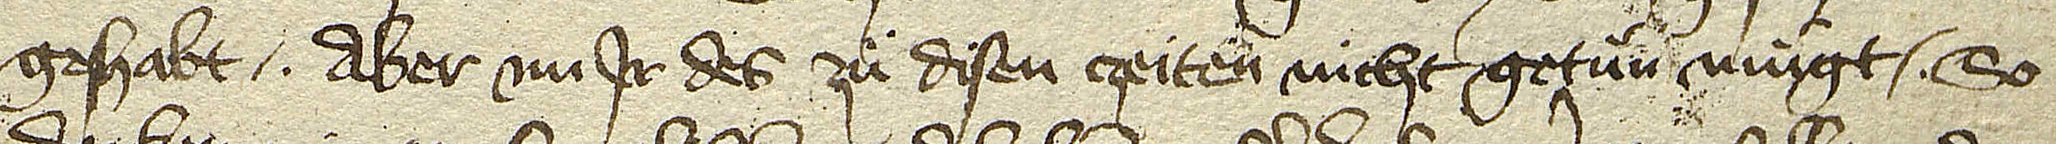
gehabt / . Aber nu Ir des ʒü diſen cʒeiten nicht getün mügt / . So
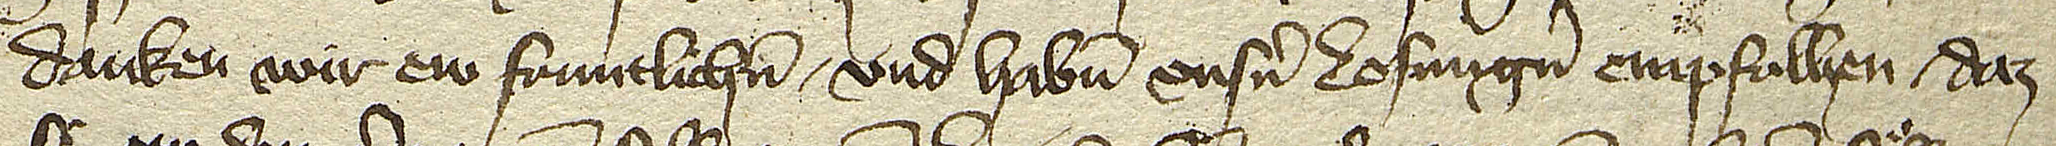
danken wir ew fruntlichn* / vnd habn* vnſn* Loſungn* empfolhen / daʒ
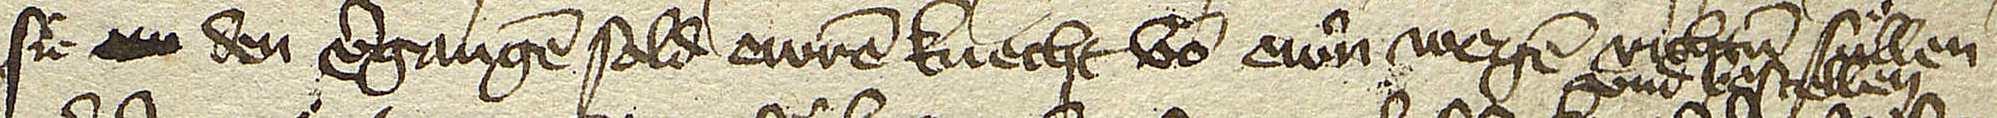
ſie ew den v*gange* ſold ewre* knecht vo* ew*n wege* richtn* ſüllen
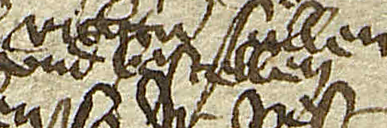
vnd beſtellen
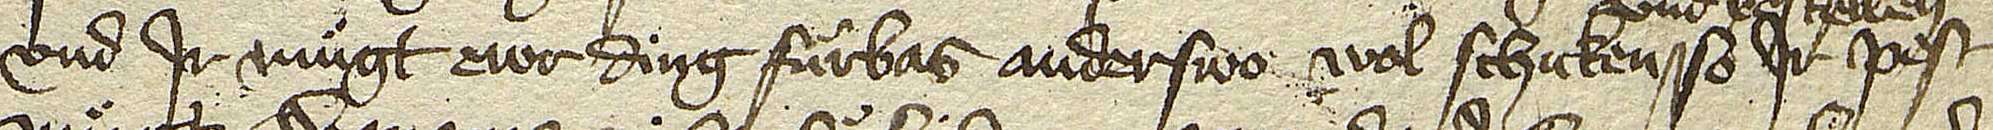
vnd ir mügt ewr ding fürbas anderſwo wol ſchicken ſo Ir peſt
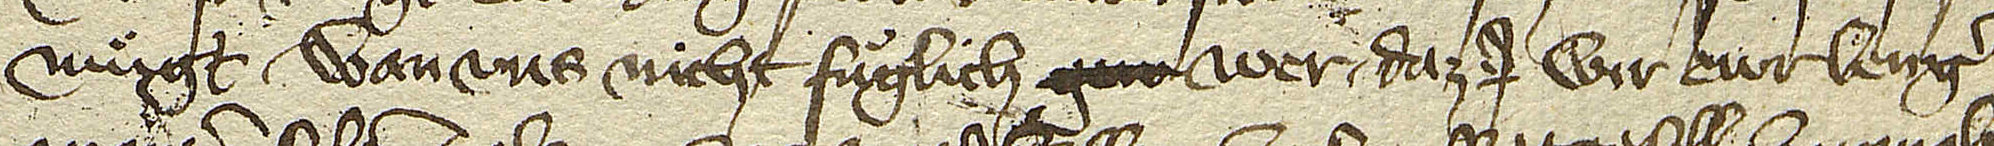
mügt / wan vns nicht füglich gew wer / daʒ I wir ewr leng*
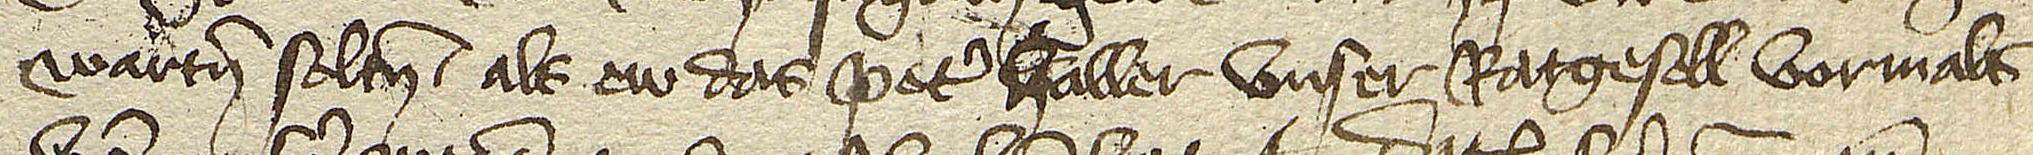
wartn* ſoltn* / als ew das pet* haller vnſer Ratgeſell vormals
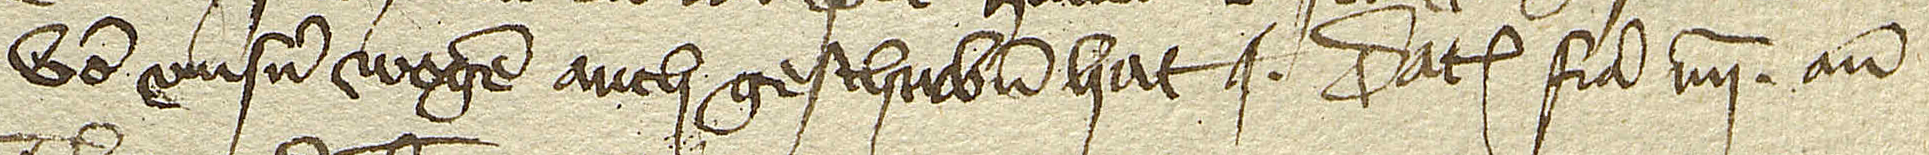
vo* vnſn* wege* auch geſchribn* hat / . Dat* fia* iiii* . an*
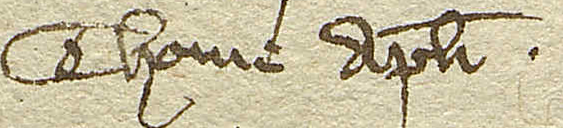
Thome Apli* .
